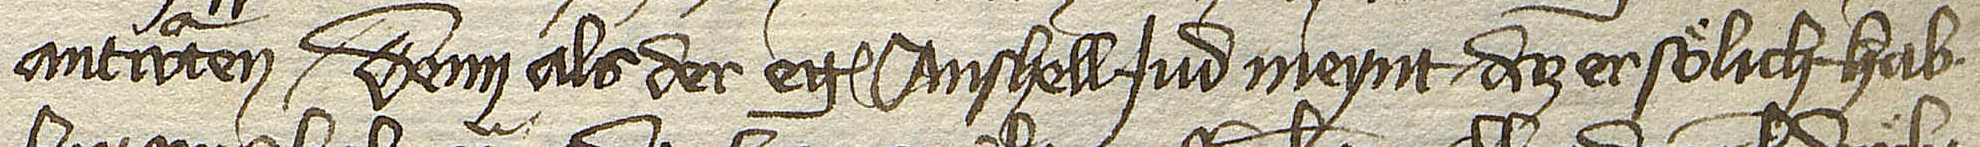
antw*ten / Denn als der eg* Anſhell Iud meynt / daʒ er ſölich hab .
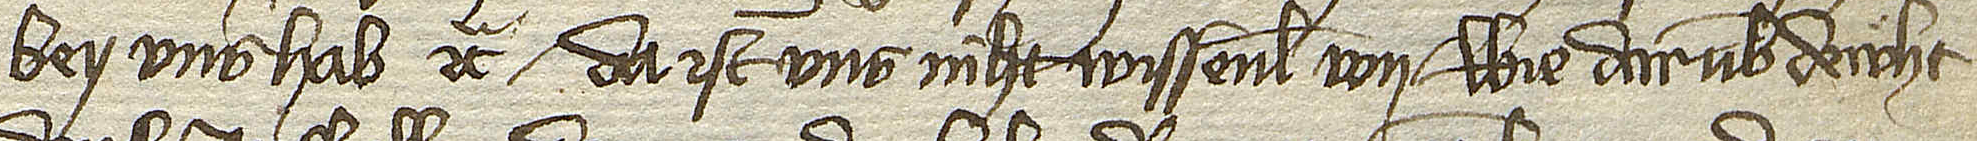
bey vns hab ec* / Da iſt vns niht wiſſenl* von / Wie darub* deẅht
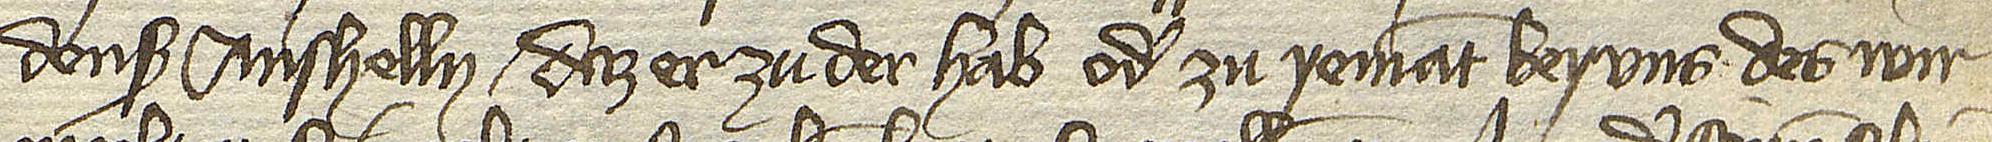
denſ* Anſhelln / Daʒ er ʒu der hab od* ʒu yema*t bey vns . des wir
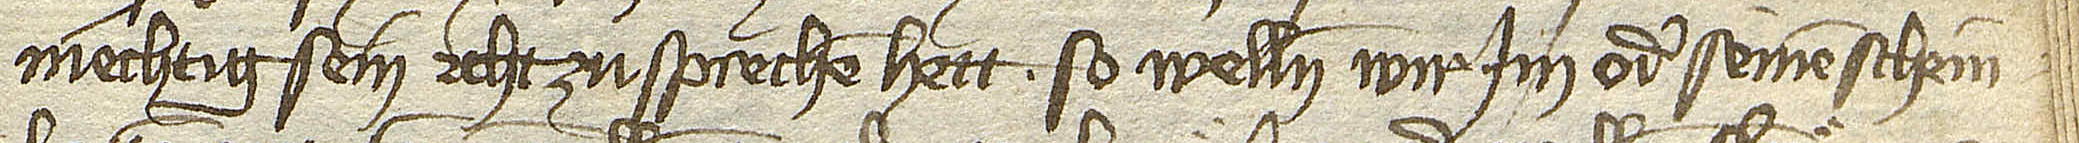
mechtig ſein icht ʒu ſpreche* hett . ſo welln* wir Im od* ſeine* ſchein =
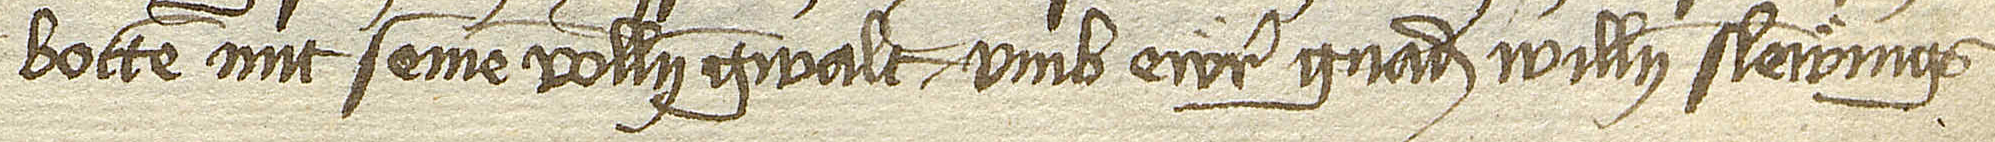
botte* mit ſeine* volln* gwalt / vmb eẅr* gnad* willn* ſleẅnigs
